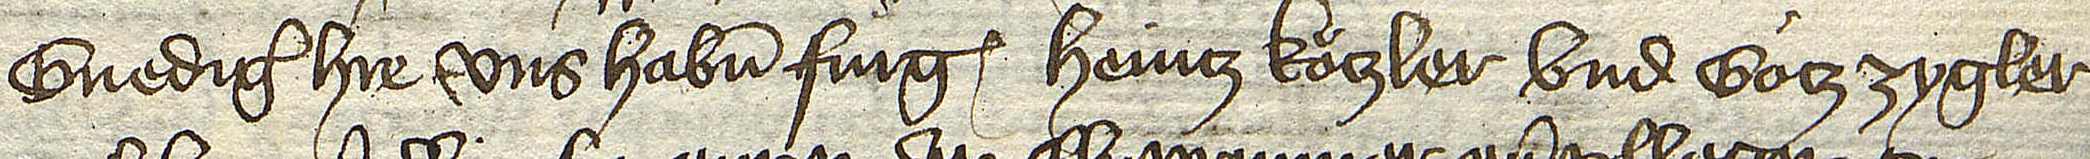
Gnedig* h*re vns hab*n fürg* heincʒ Köcʒler vnd Göcʒ ʒygler
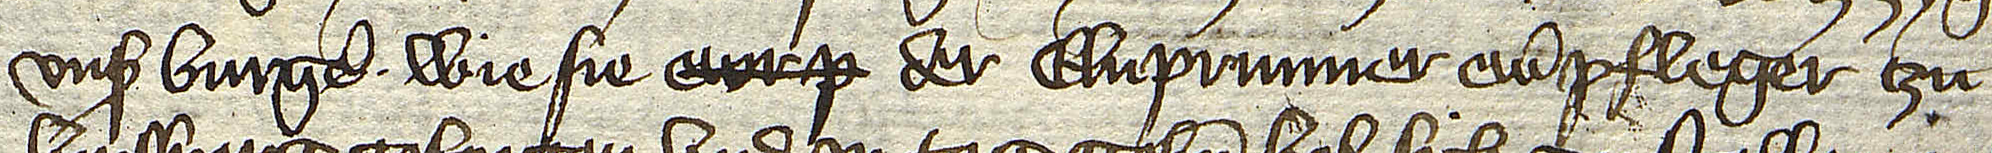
vnſ* burge* . Wie ſie ewr p der Elnprunner ew* pfleger cʒu
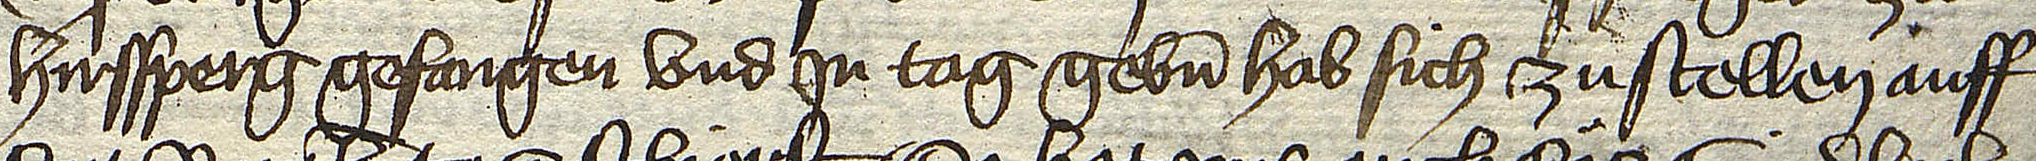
hirſſperg gefangen vnd In tag geb*n hab ſich cʒu ſtellen auff
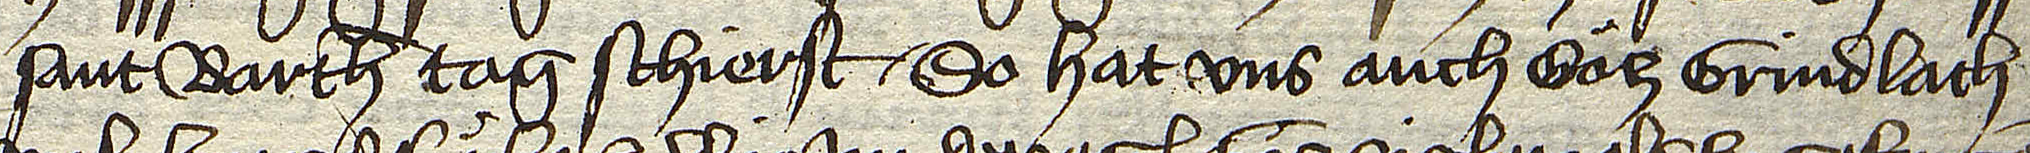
ſant Barth* tag ſchieriſt / So hat vns auch Göcʒ Grindlach
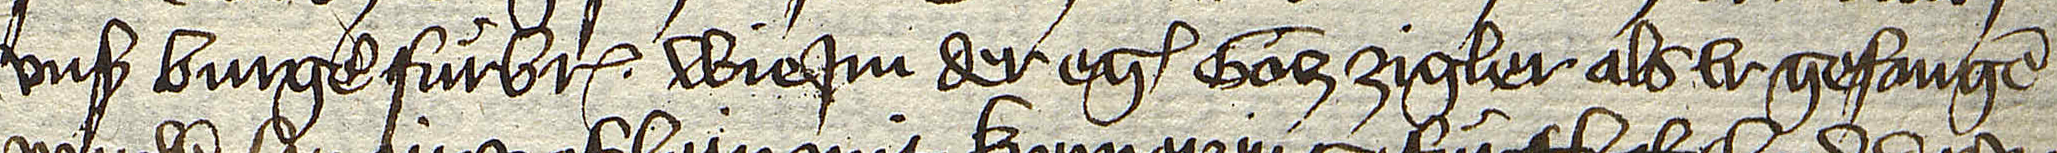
vnſ* burge* fürbr* . wie Im der eg* Göcʒ ʒigler als Er gefange*
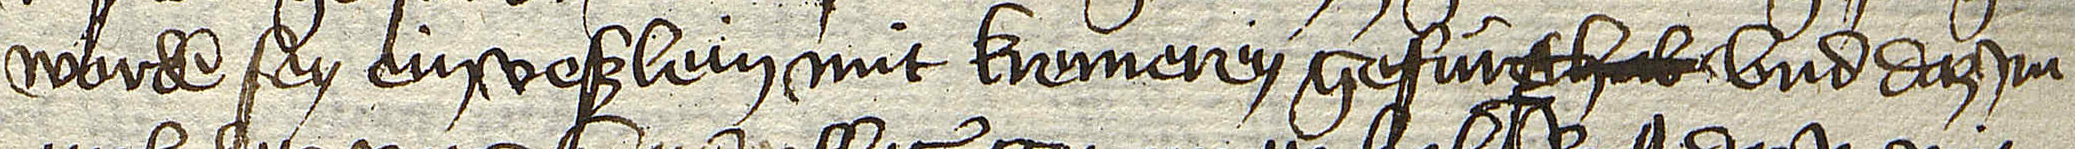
worde* ſey ein veſʒlein mit kremerey gefürt hab / vnd daʒ Im
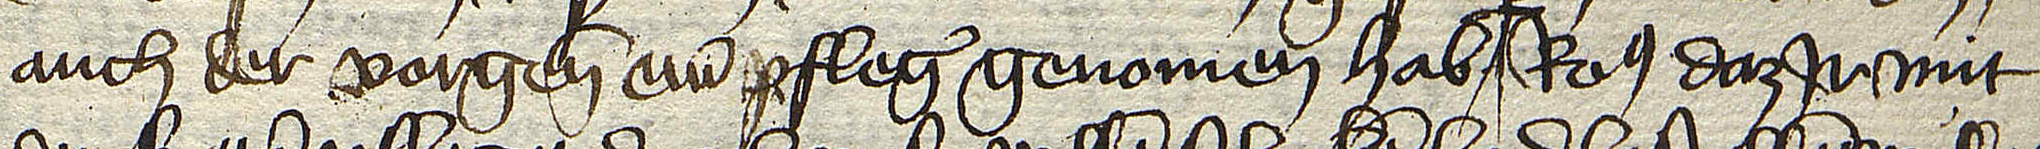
auch der vorgen* ew* pfleg* genomen hab Ro* . daʒ Ir mit
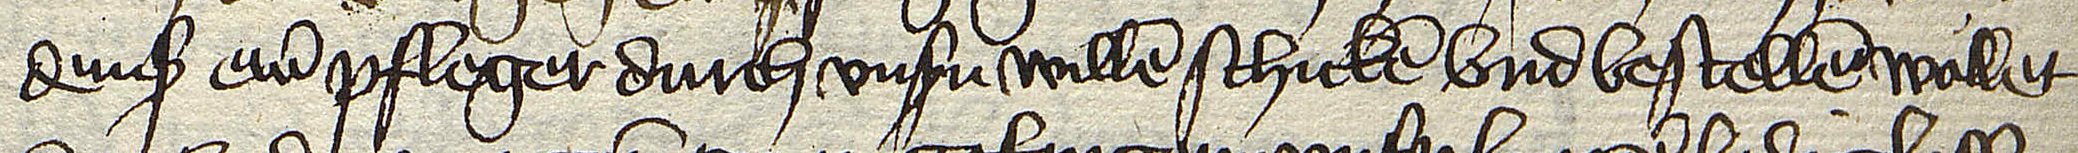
demſ* ew* pfleger durch vnſ*n wille* ſchike* vnd beſtelle* wöllet
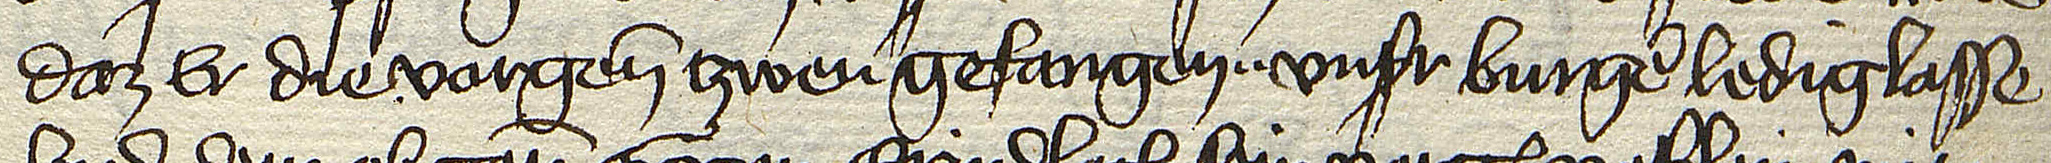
daʒ Er die vorgen* cʒwen gefangen ~ vnſ*r burge* ledig laſſe
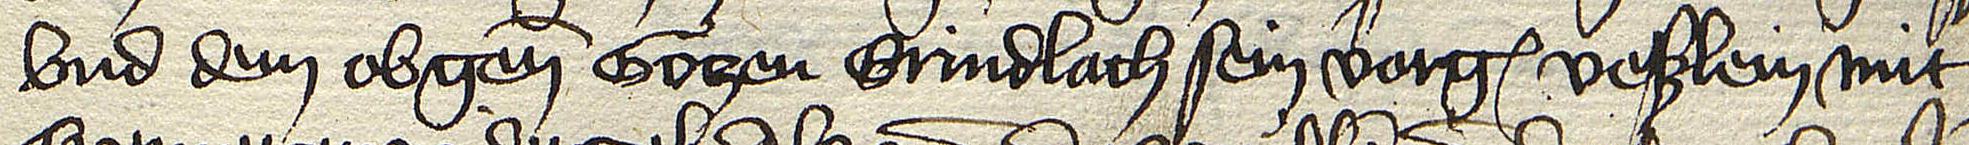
vnd dem obgen* Göcʒen Grindlach ſein vorg* veſʒlein mit
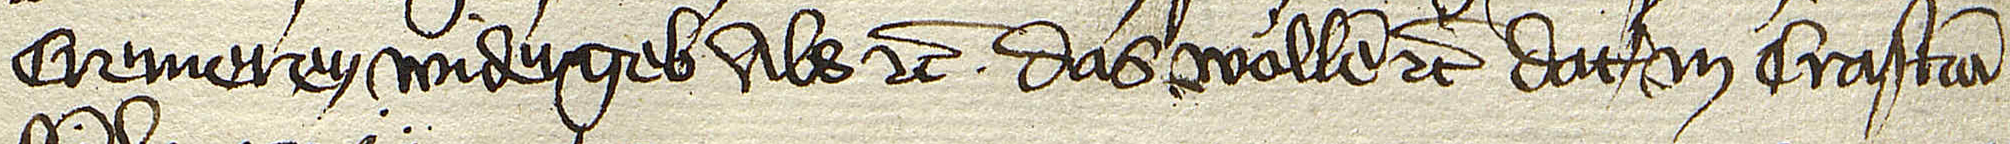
Cremerey widerrgeb . Als ec* . Das wölle* ec* dat* in Craſtinu*
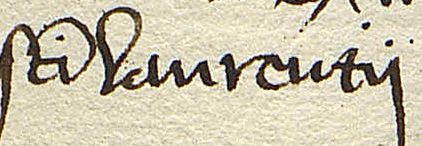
ſci laurencii
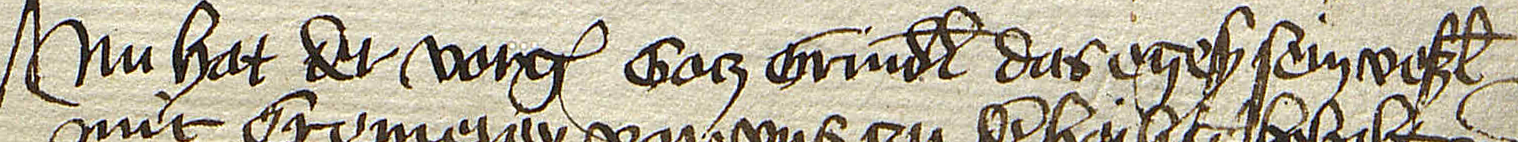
Nu hat der vorg* Gocʒ Grindl* das egeſ* ſein veſʒl*
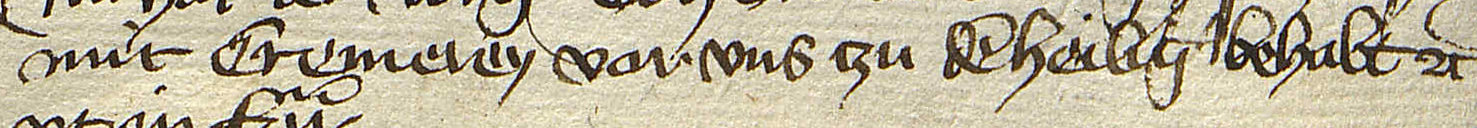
mit Cremerey vor vns cʒu de* heilig* behabt ec*
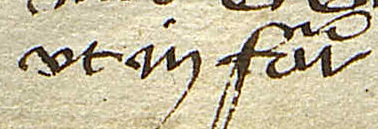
vt in for*
